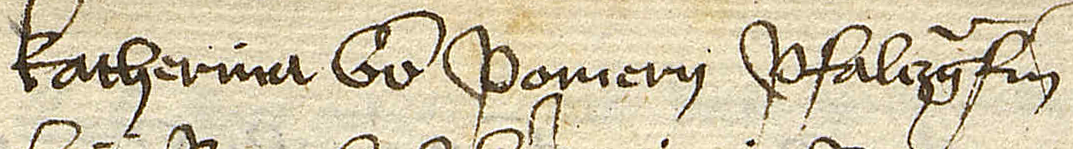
Katherina vo* Pomern Pfalcʒg*fin
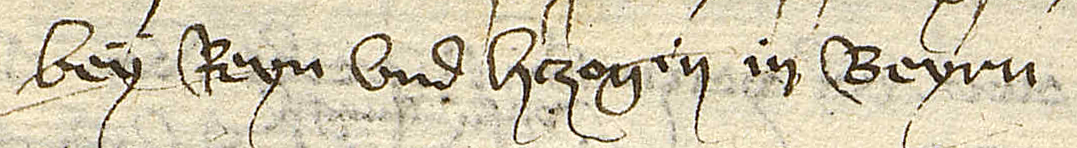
bey Reyn vnd h*cʒogin in Beyrn
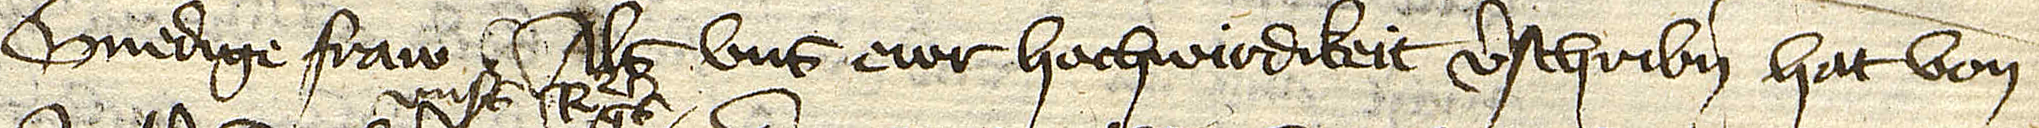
Gnedige fraw / Als vns ewr hochwirdikeit v*ſchribn* hat von
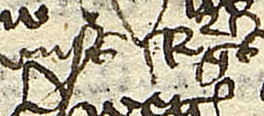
vnſs* B*gs*
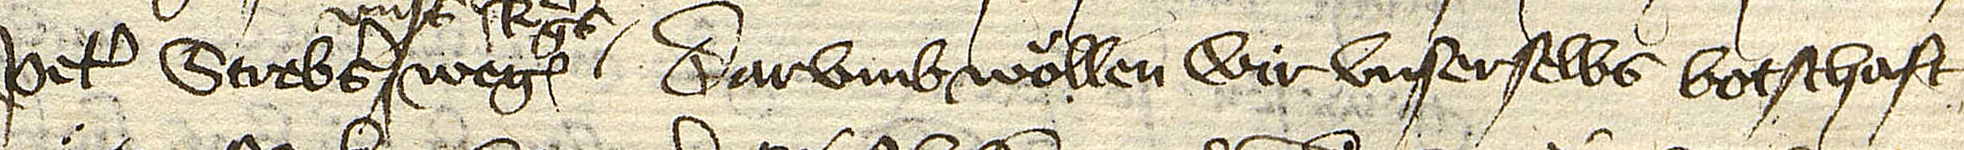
Pet* Strebs* weg* / Darvmb wöllen wir vnſerſelbs botſchaft
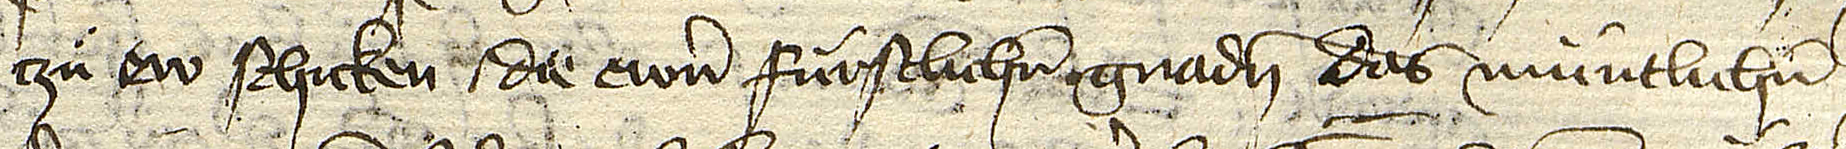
cʒu ew ſchicken / die ewn* fürſtlichn* gnadn* das müntlichn*
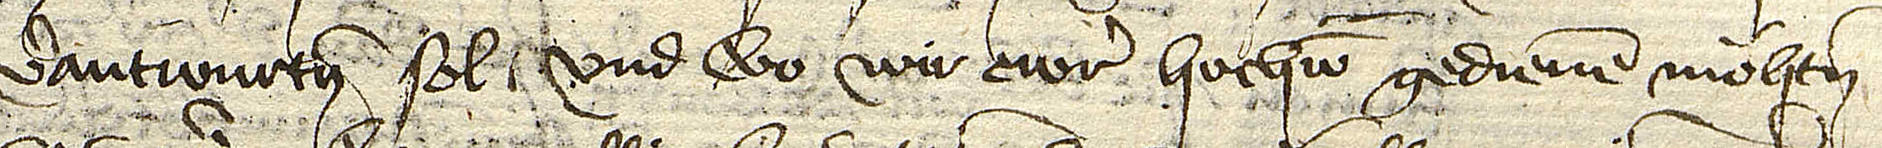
v*antwurtn* ſol / vnd wo wir ewr* hochw* gediene* möhtn*
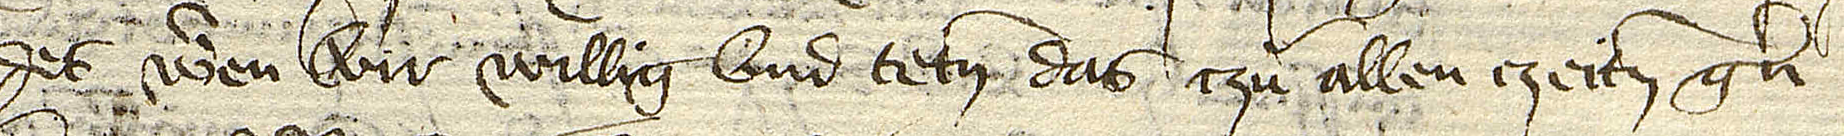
des wen* wir willig vnd tetn* das cʒü allen cʒeitn* gn*
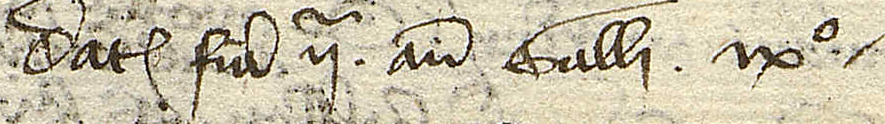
Dat* fia* ii* an* Galli . ix* . /
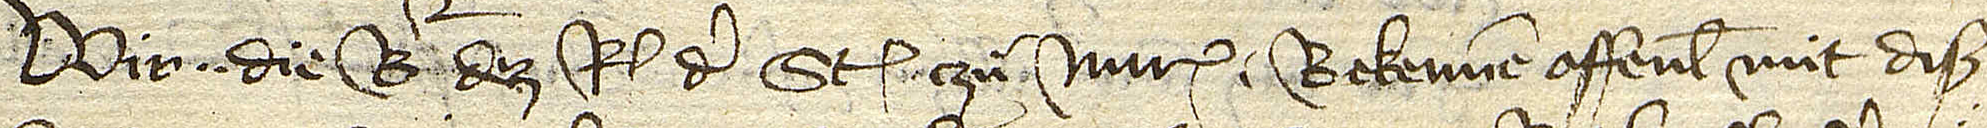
Wir ~ die B* deʒ R* d* St* cʒü Nur* / Bekenne* offenl* mit diſ*
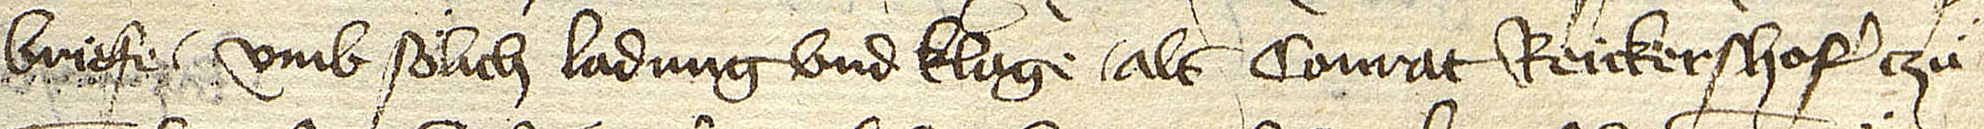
briefe / vmb ſölich ladung vnd klage / als Conrat Reickerſhof* cʒü
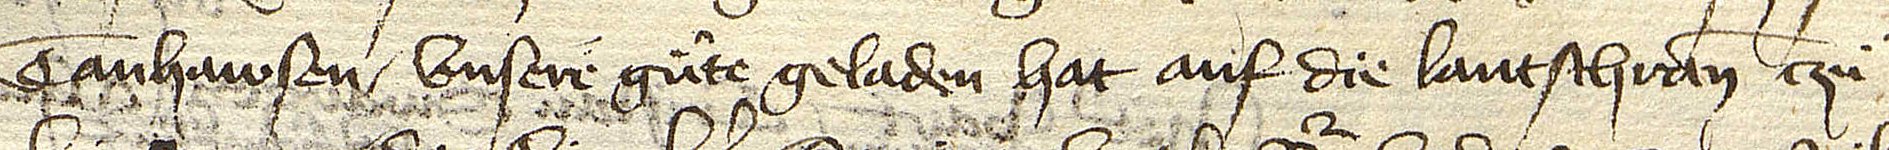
Tanhawſen / vnſere güte geladen hat auf die lantſchran* cʒü
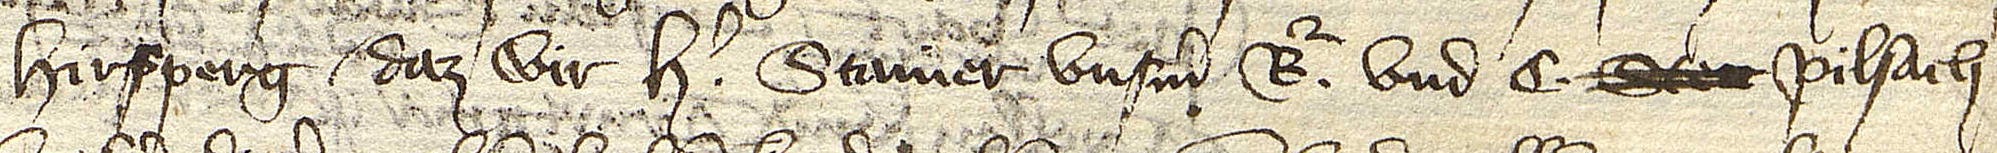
hirſperg / daʒ wir h* . Stainer vnſm* B*. vnd C. Stei Pilſach*
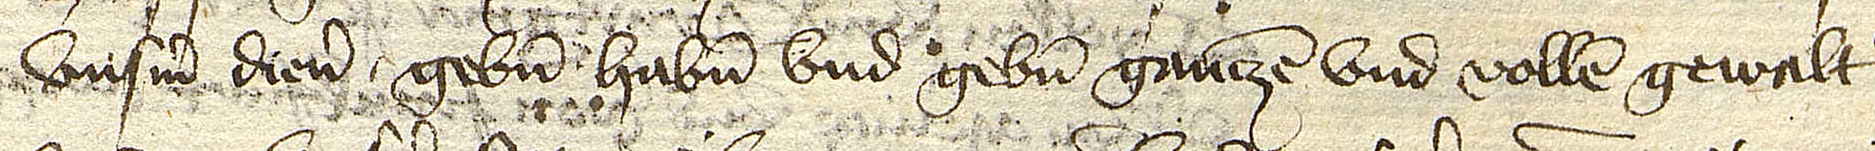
vnſm* dien* / gebn* habn* vnd gebn* gancʒe* vnd volle* gewalt
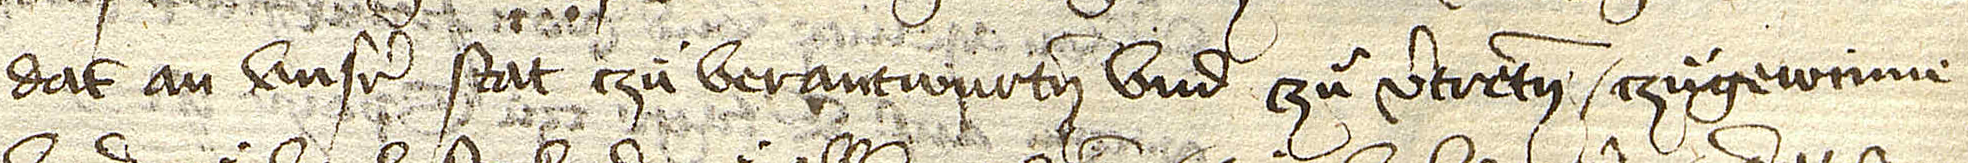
das an vnſr* ſtat cʒü verantwurtn* vnd cʒü v*tretn* / cʒügewinne
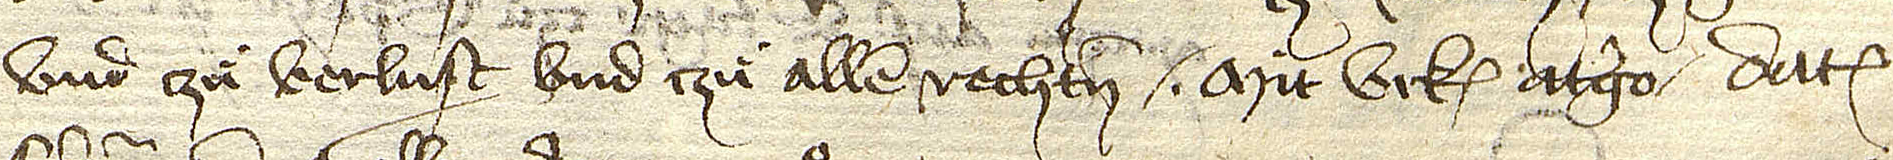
vnd cʒü verluſt vnd cʒü alle* rechtn* / . Mit vrk* at*go / dat*
